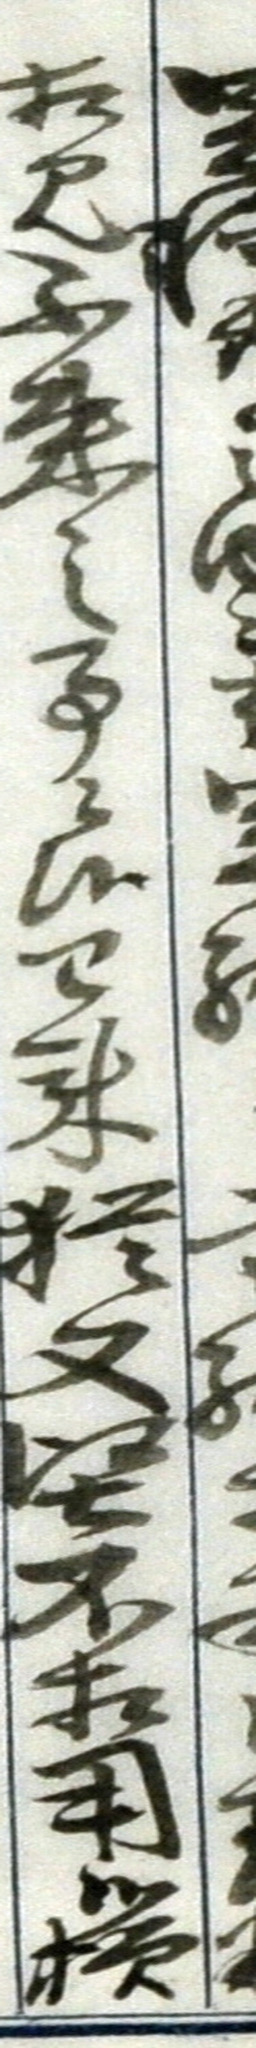相見不束之事ニ候已来猶又堅不相用候様
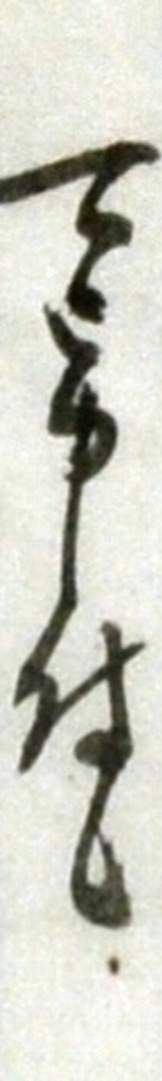可被申付候
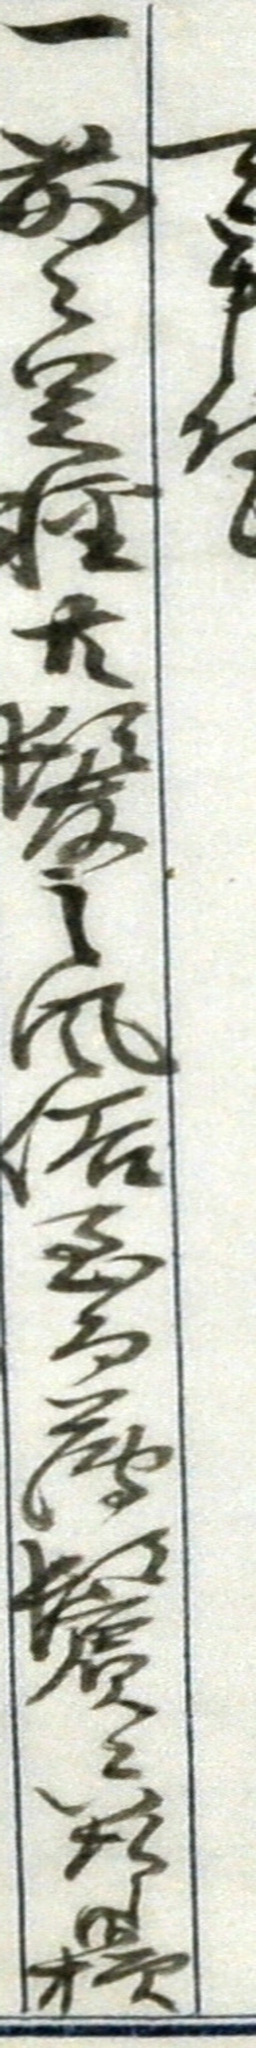一前々足軽共髪之風俗至而薄鬢ニいたし候様
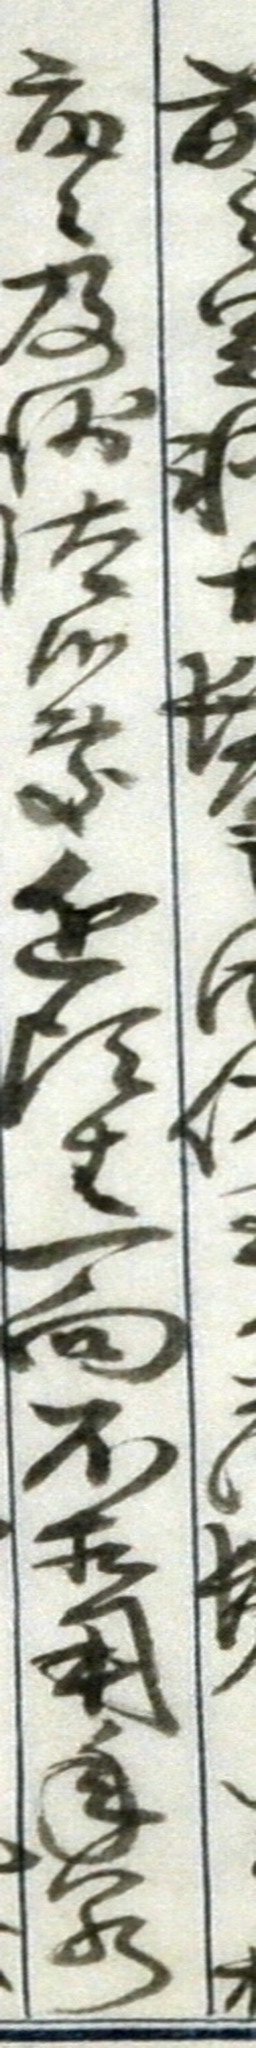度々及沙汰候処近頃は一向不相用年若
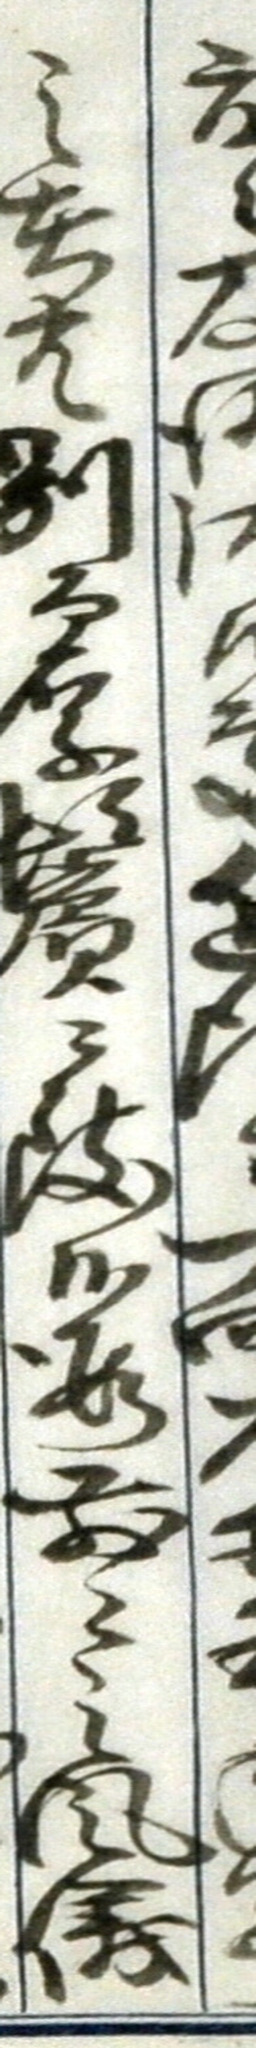之者共別而厚鬢ニ致候段前々之風儀
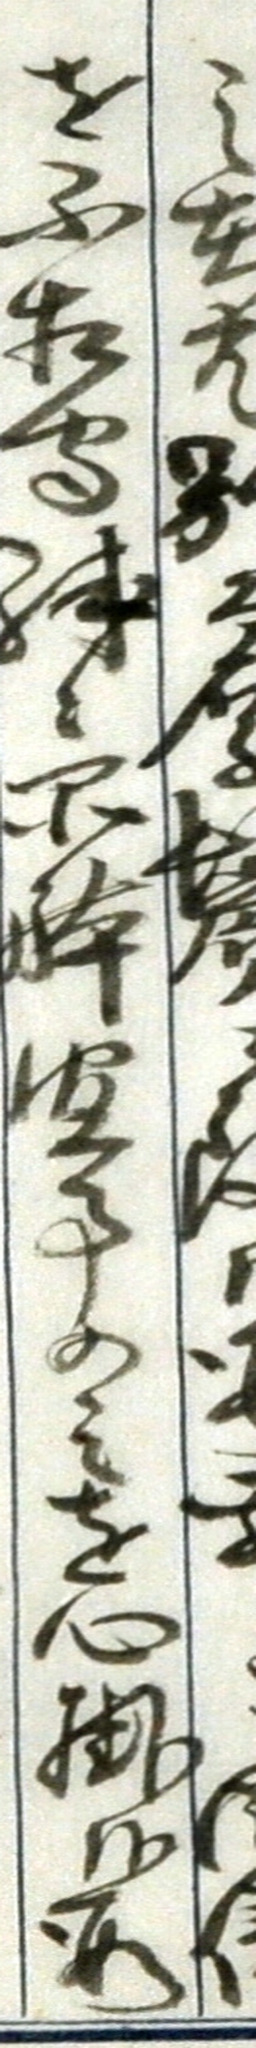を不相守殊ニ品躰宜事のミを心掛候段
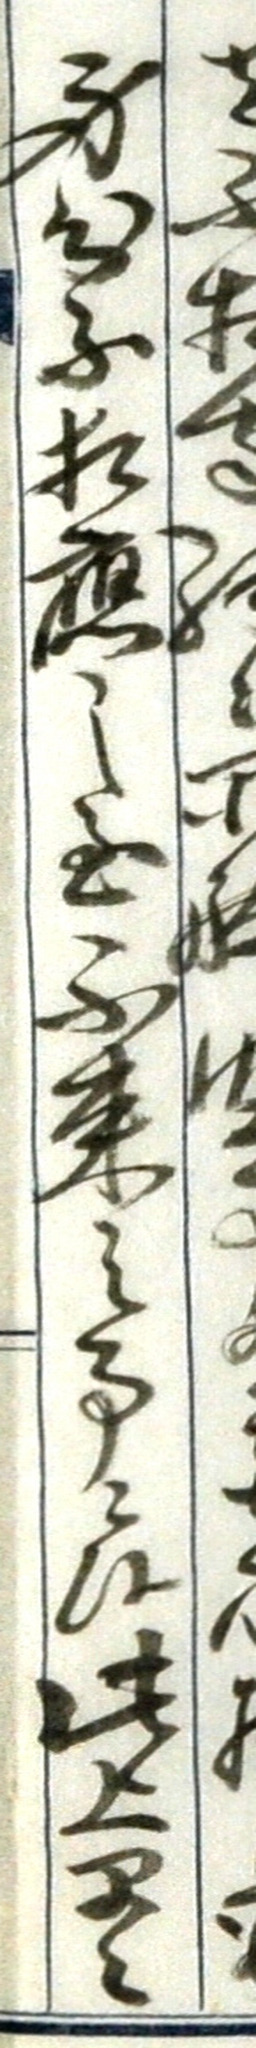身分不相応之至不束之事ニ候此上早々

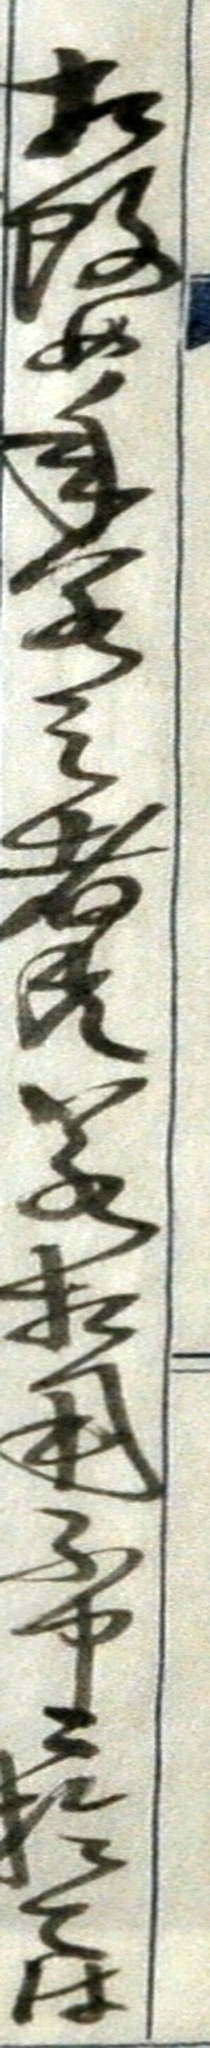相改め年若之者共若相用不申ニ於ては
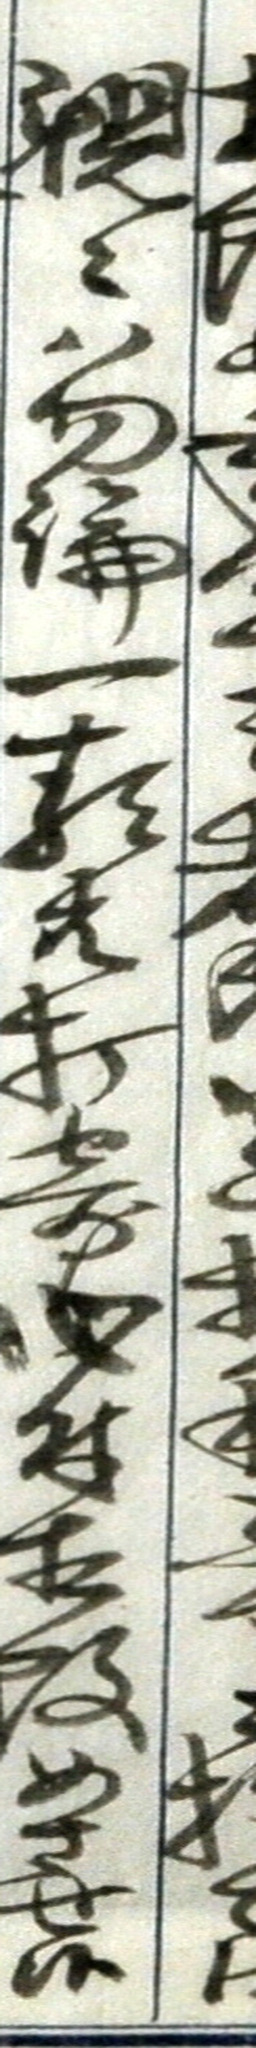親ニハ勿論一類共打寄心付相改めさせ候
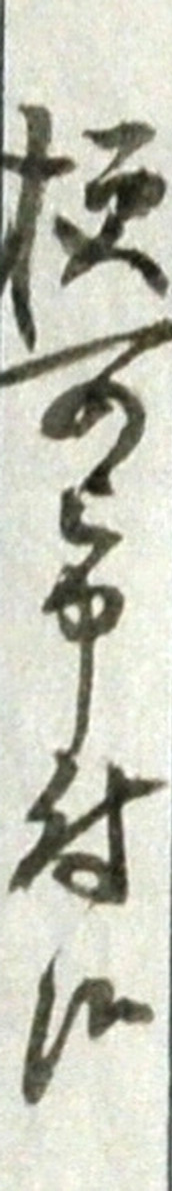様可被申付候
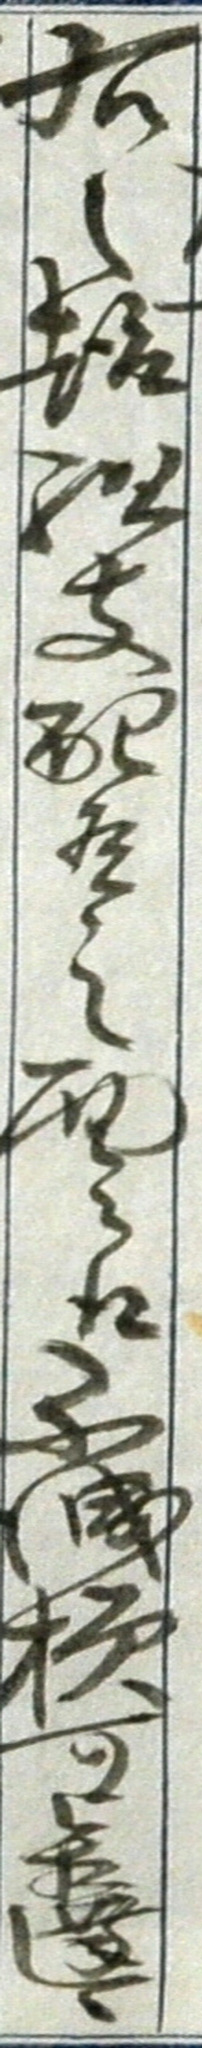右之趣組支配有之面々江不洩様可被相達候
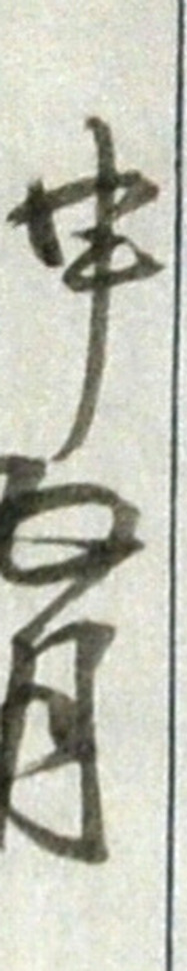申五月
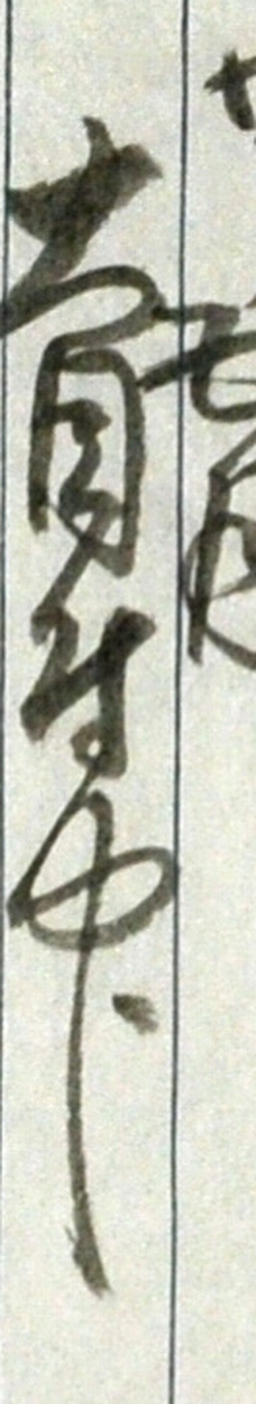大目付中
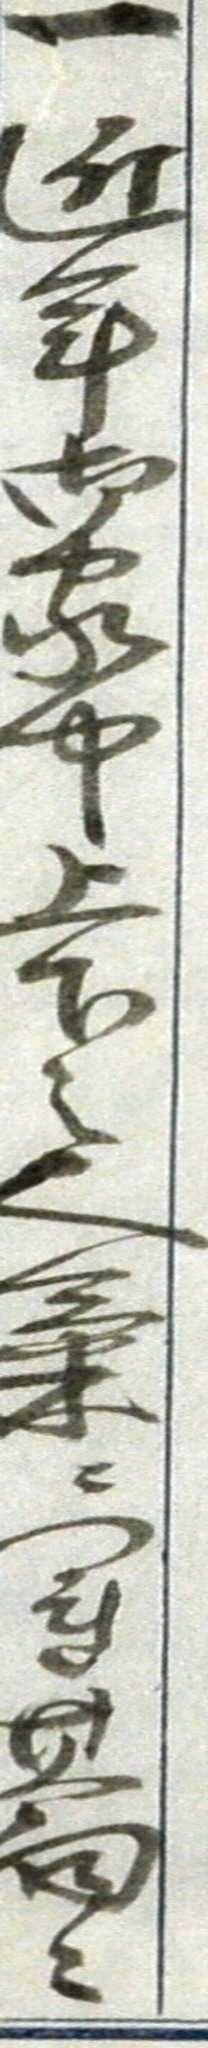一近年御家中上下之人気ニつれ其向ニ
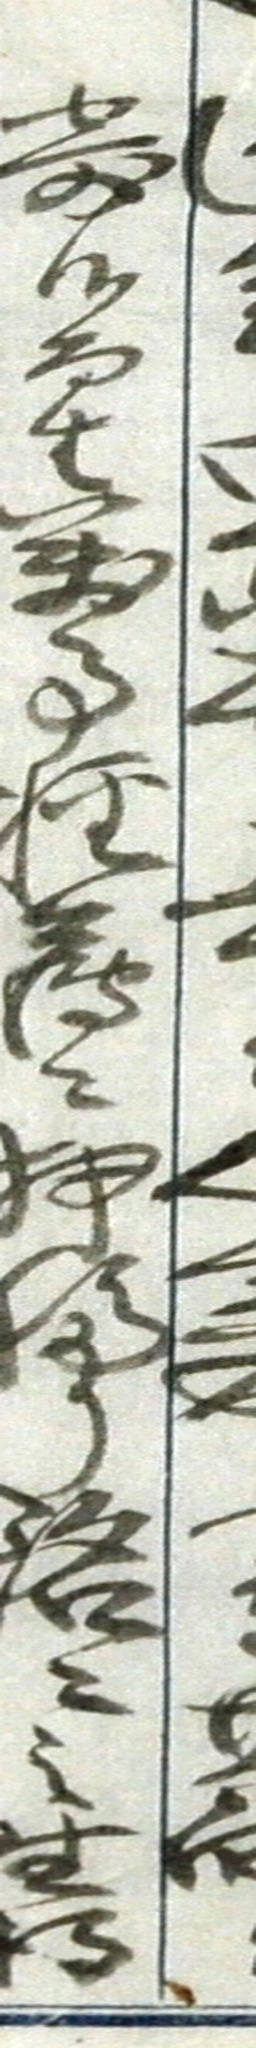寄候而は万事軽薄ニ押移り銘々之生得
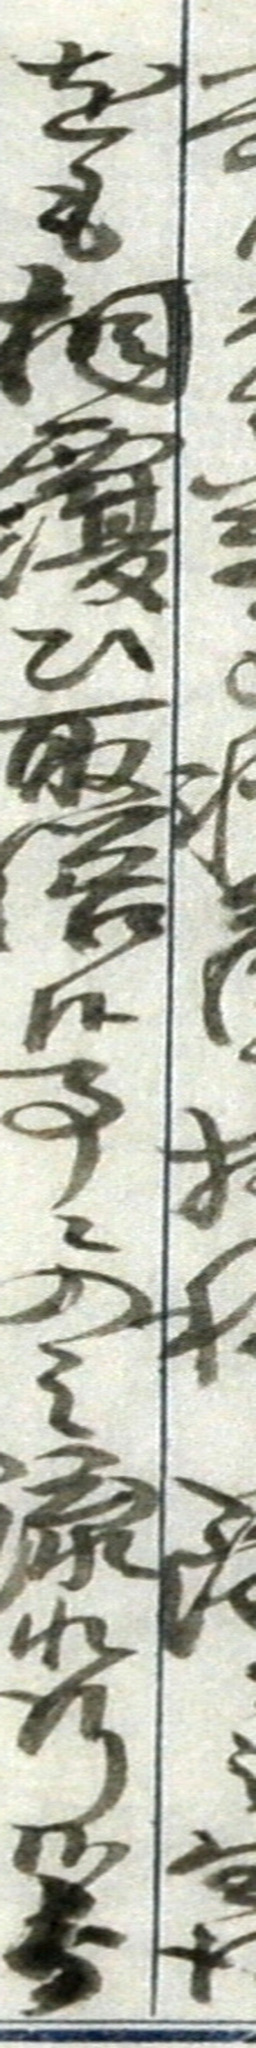をも相覆ひ取繕候事ニのミ流れ行候分
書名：御倹約被仰出書
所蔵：伊那市立高遠町図書館・合同会社AMANE
